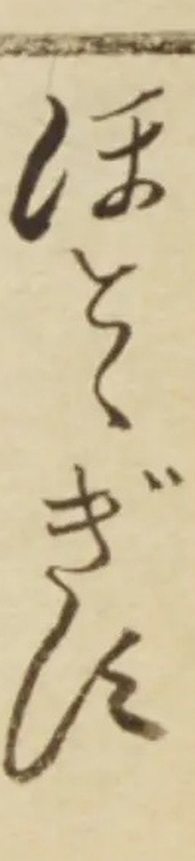ほとゝぎす
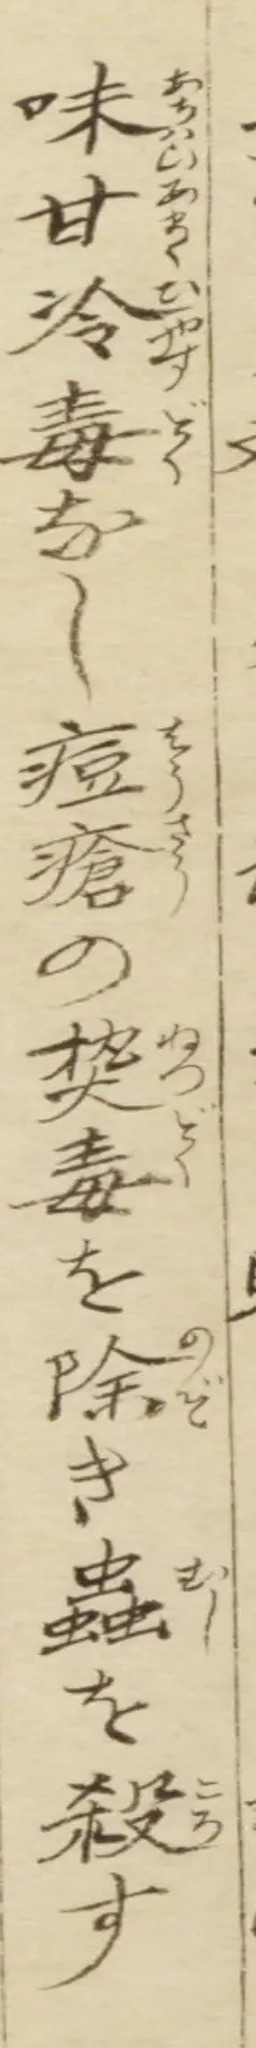味甘冷毒なし痘瘡の熱毒を除き虫を殺す
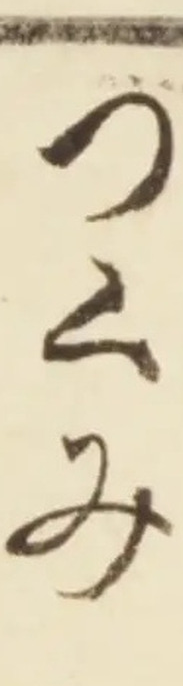つくみ

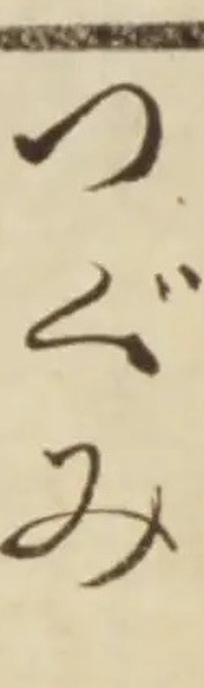つぐみ
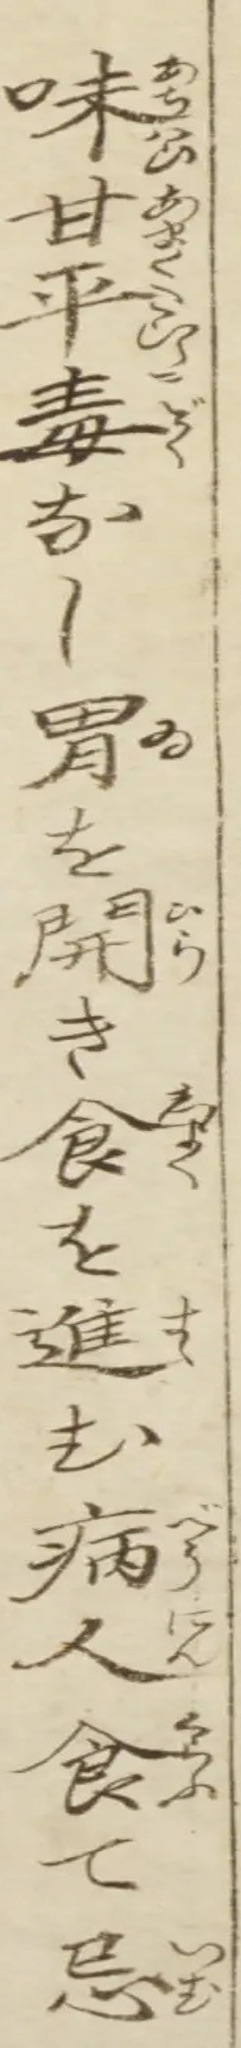味甘平毒なし胃を開き食を進む病人食て忌
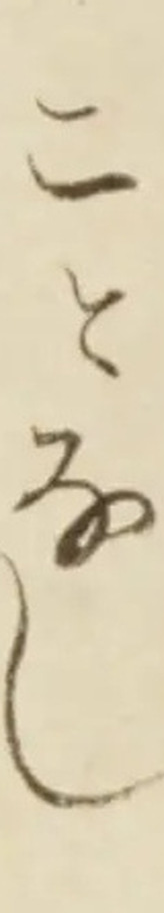ことなし
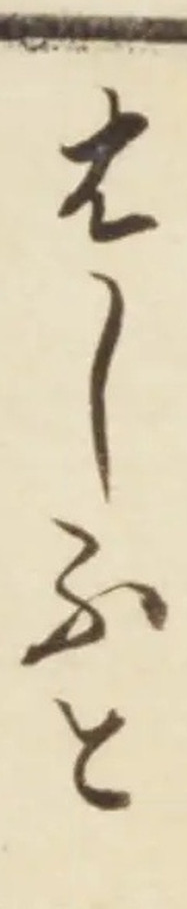はしふと

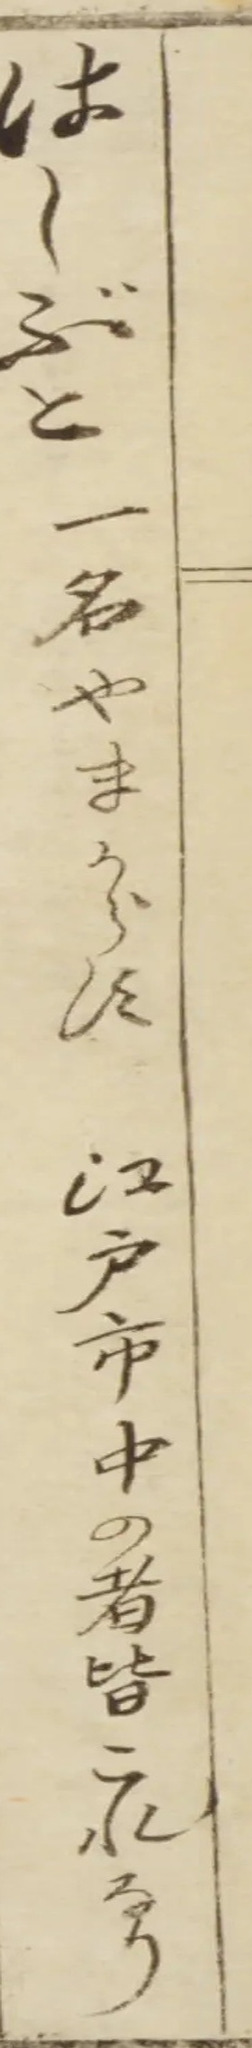はしぶと一名やまからす江戸市中の者皆これなり
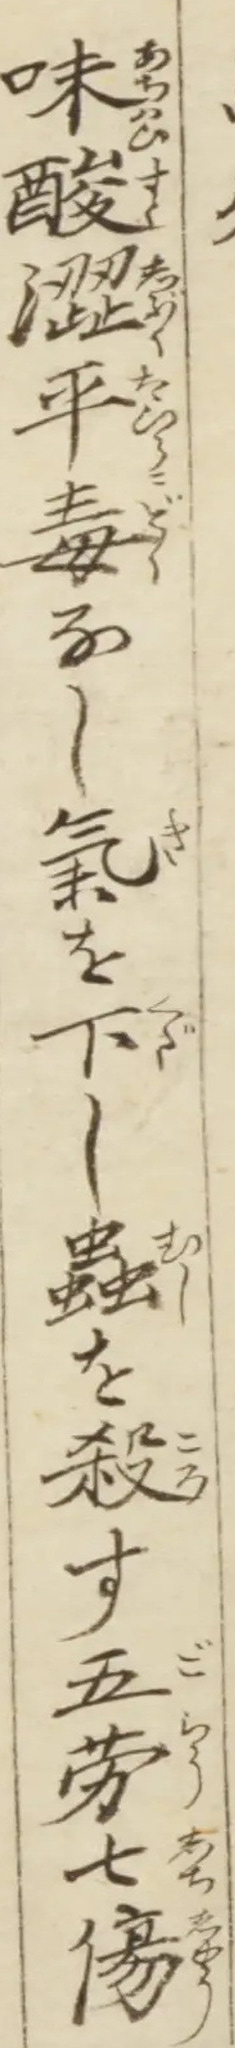味酸渋平毒なし気を下し虫を殺す五労七傷
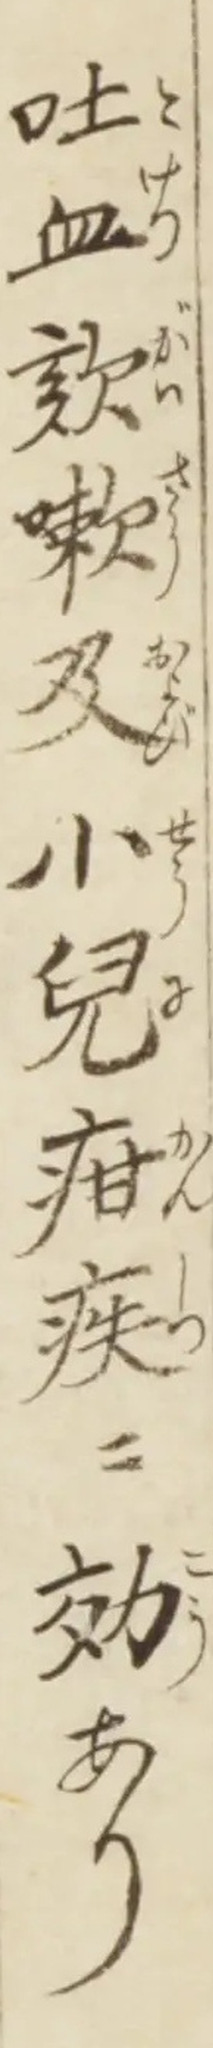吐血欬嗽及小児疳疾に効あり
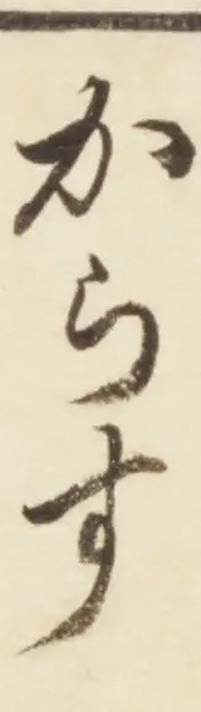からす

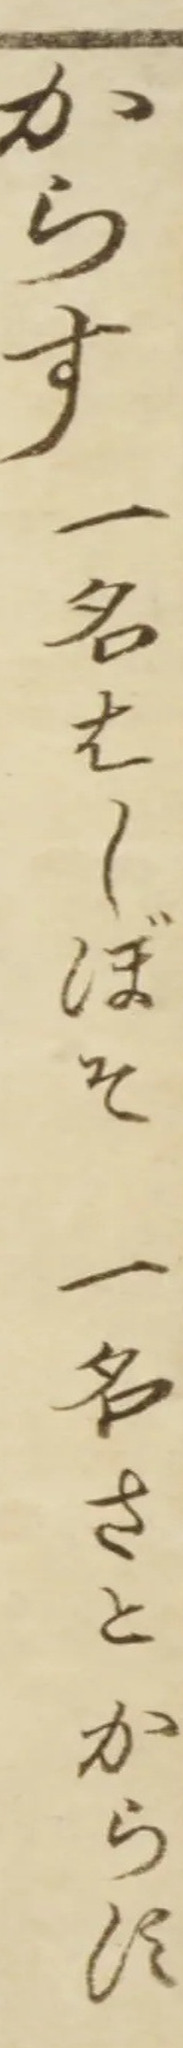からす一名はしぼそ一名さとからす
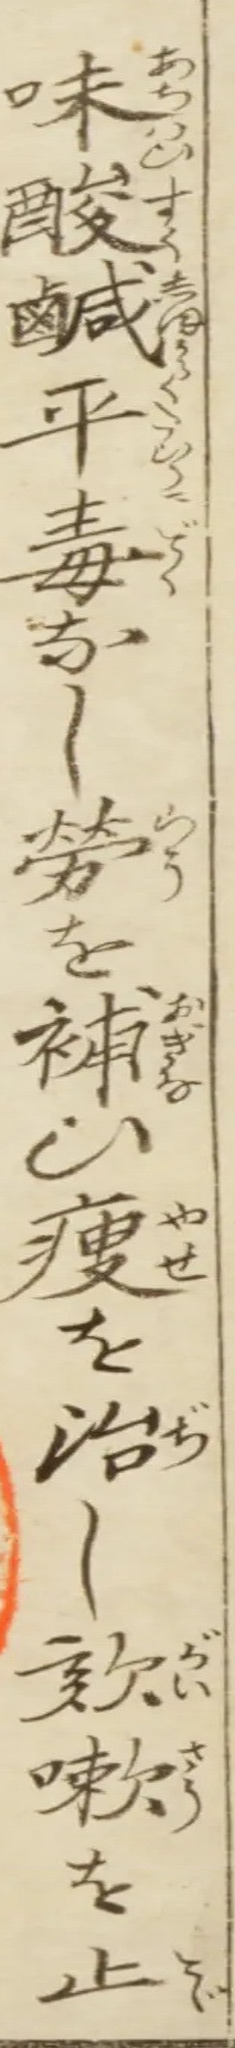味酸鹹平毒なし労を補ひ痩を治し欬嗽を止
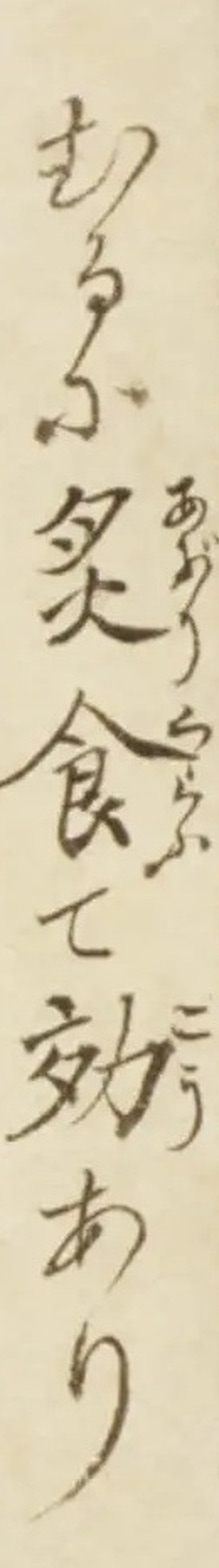むるに炙食て効あり
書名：華鳥譜
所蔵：国立国会図書館 National Diet Library, JAPAN
